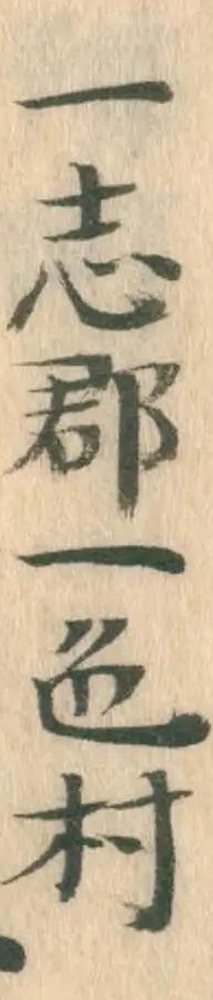一志郡一色村
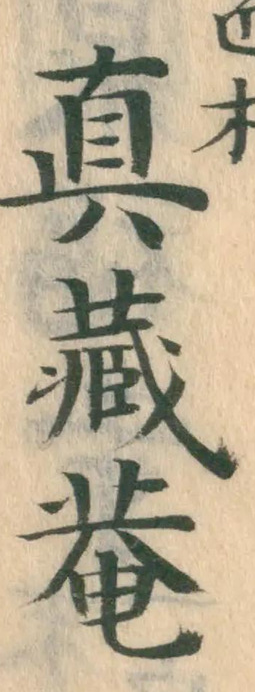真蔵庵
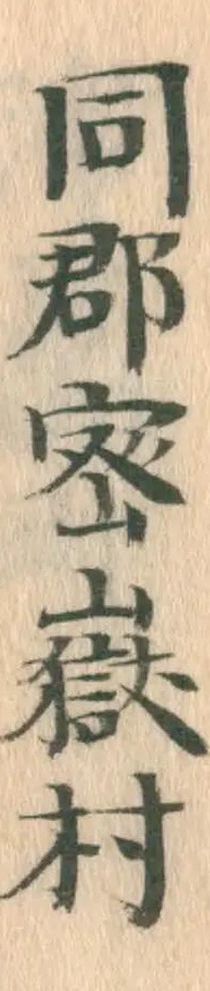同郡密嶽村
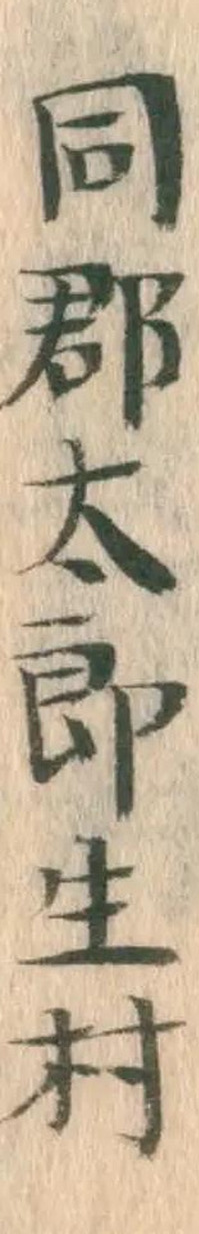同郡太郎生村
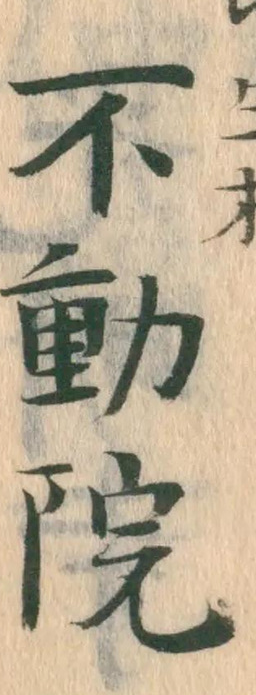不動院
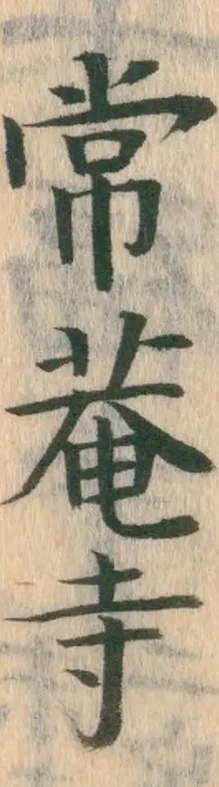常庵寺
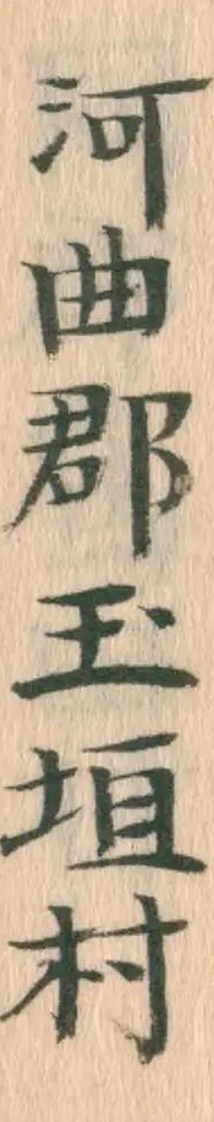川曲郡玉垣村
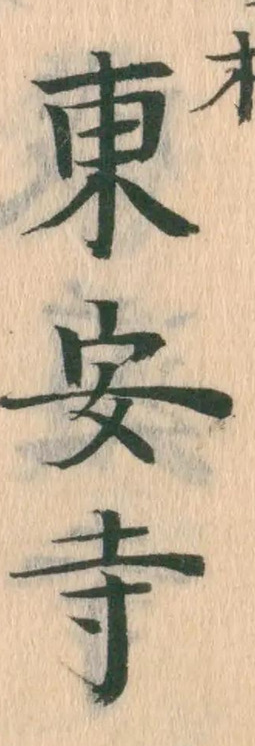東安寺
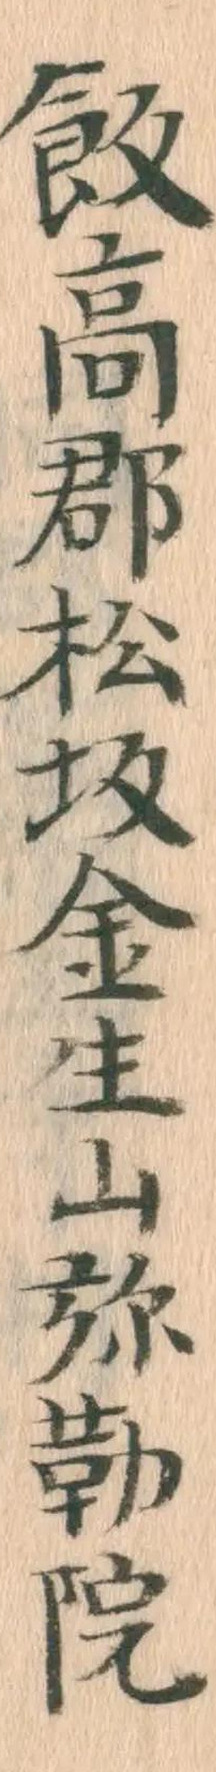飯高郡松坂金生山弥勒院
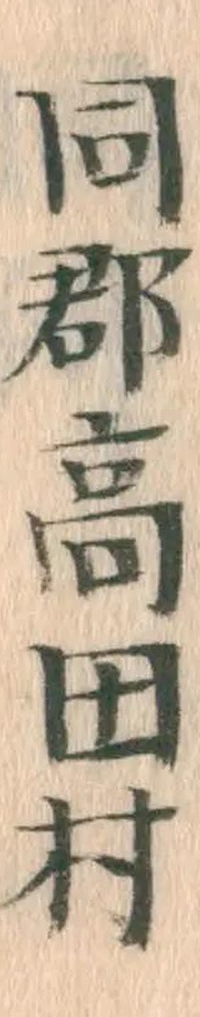同郡高田村
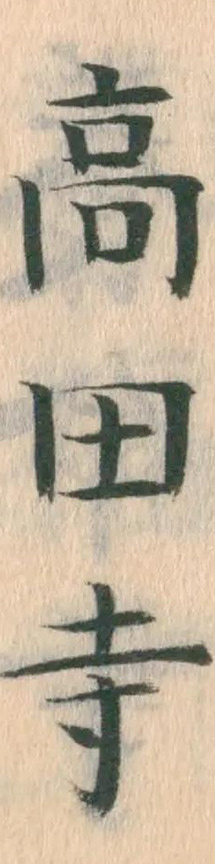高田寺
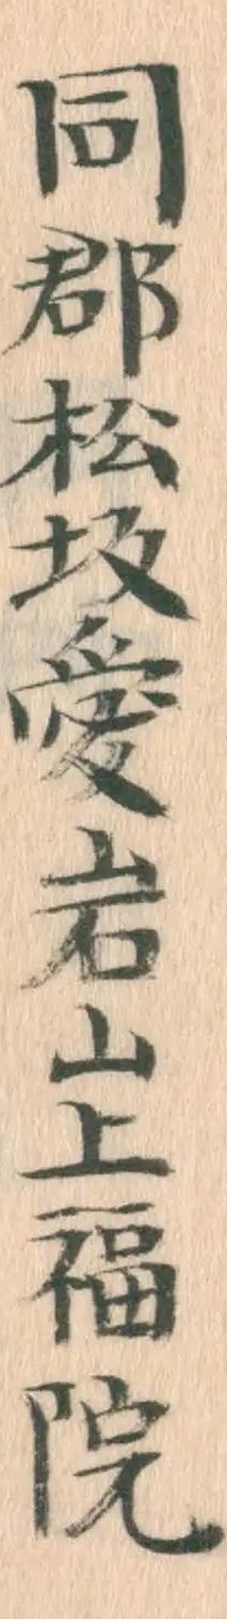同郡松坂愛宕山上福院

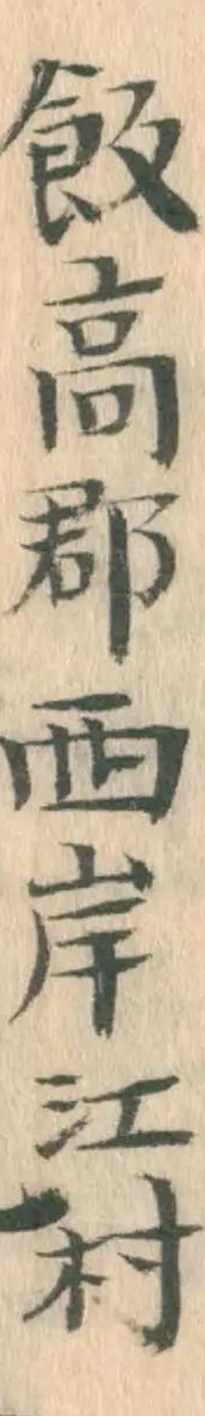飯高郡西岸江村
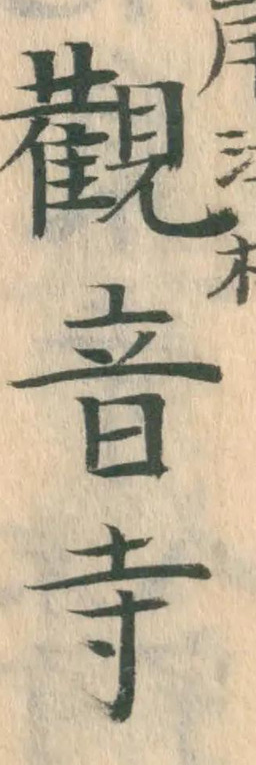観音寺
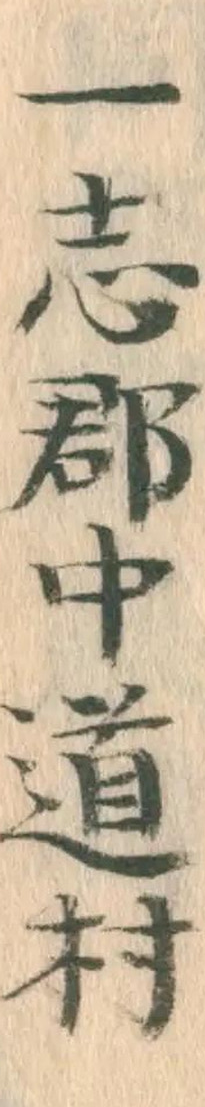一志郡中道村
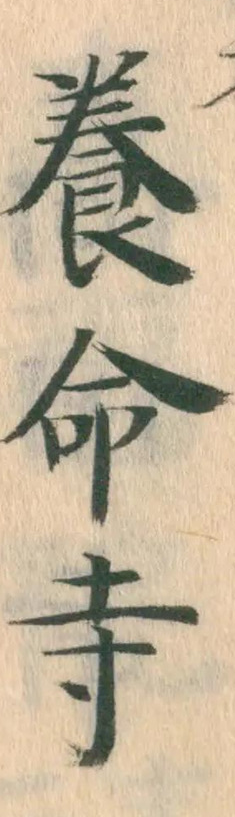養命寺
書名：古義真言宗本末帳 21巻. [4] 第三 伊賀国、伊勢国、志摩国、尾張国、三河国、遠江国、駿河国、伊豆国、甲斐国
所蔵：国立国会図書館 National Diet Library, JAPAN
